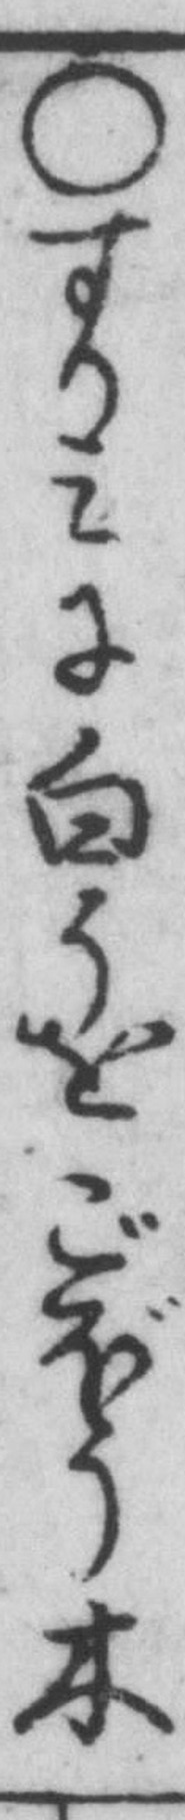〇すりミに白うをごぼう木
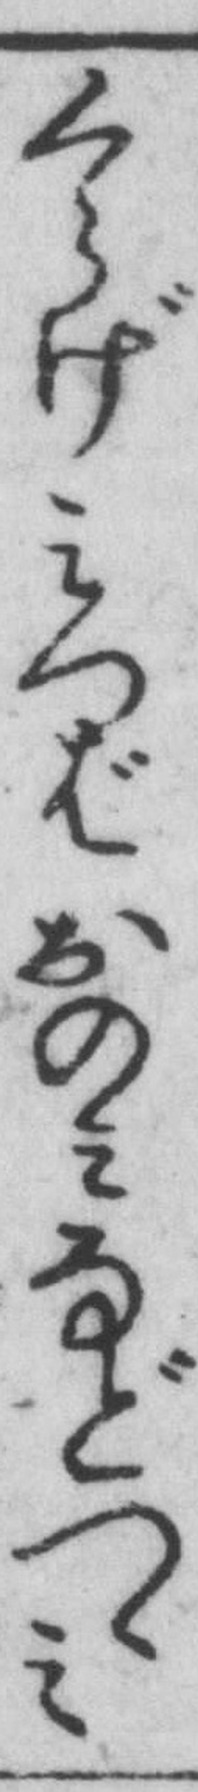くらげミつばのミなどつゝミ
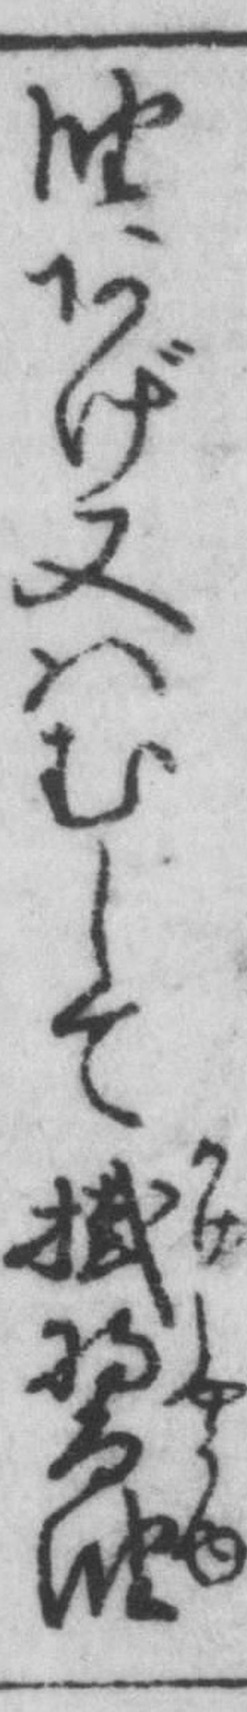あげ又ハむして掛醤油
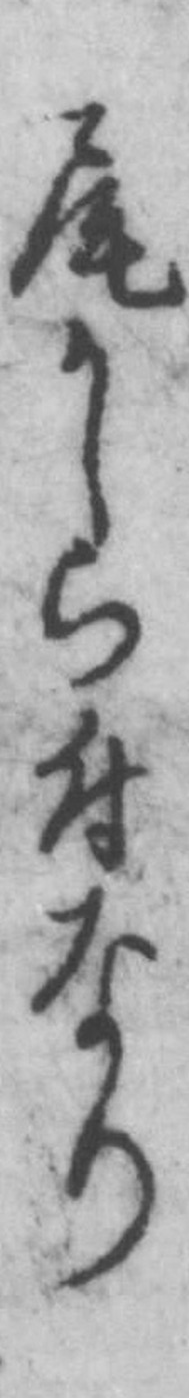尾かしら付なり
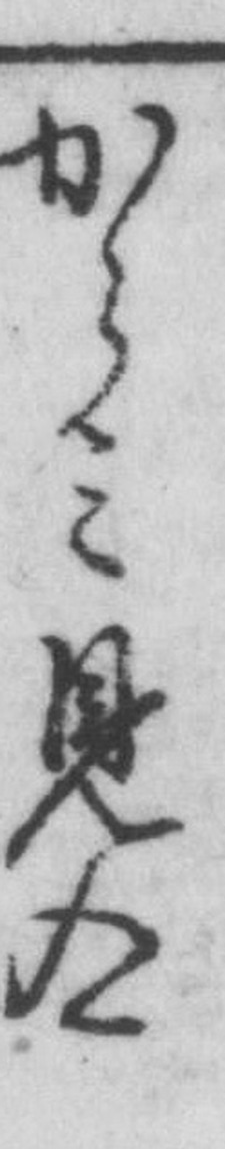からミ見合
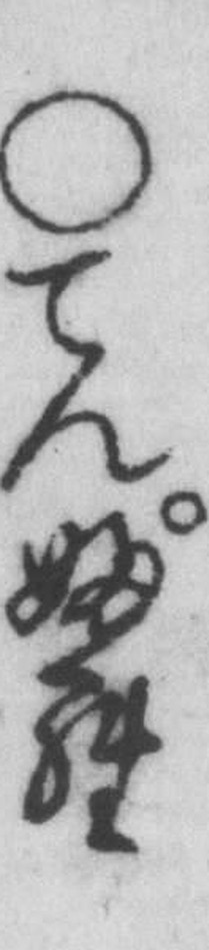〇てんぷら
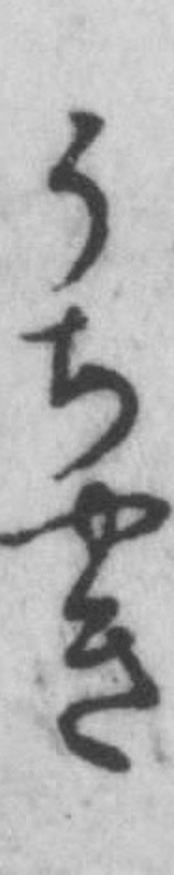うちやき
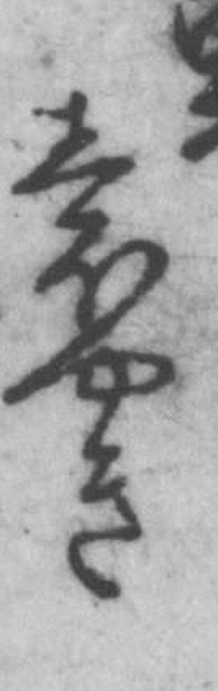しほやき
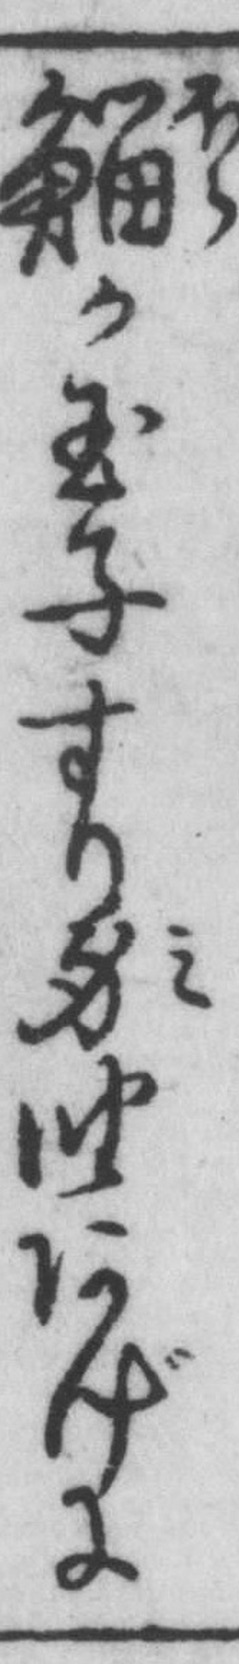鯔か玉子すりミあげに
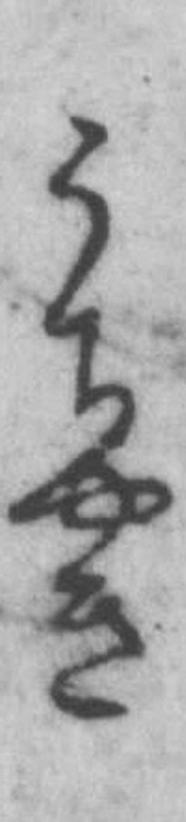うちやき
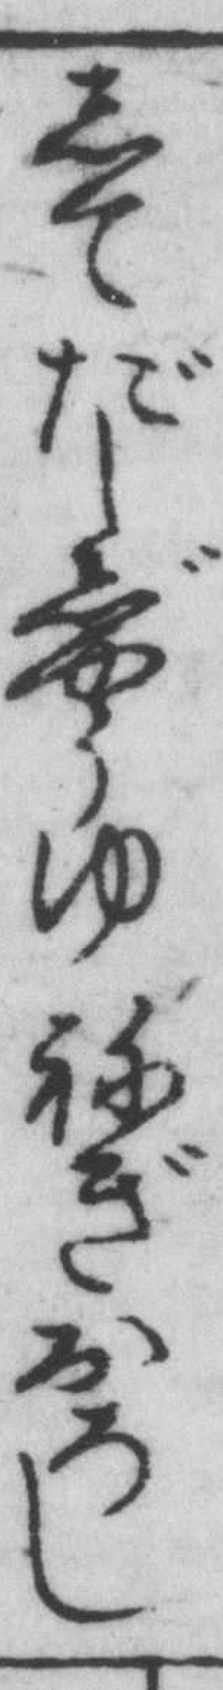してだしじやうゆねぎおろし
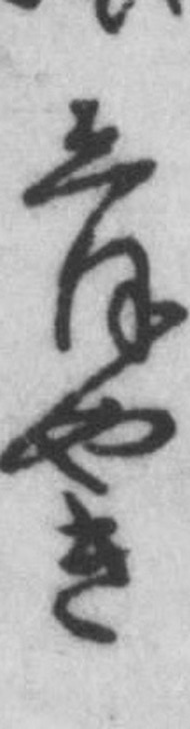しほやき
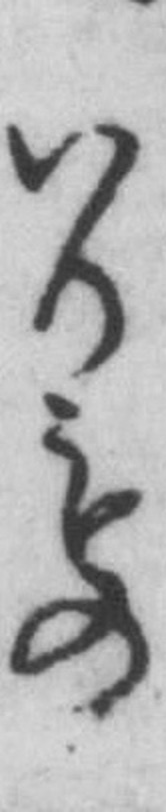いりもの
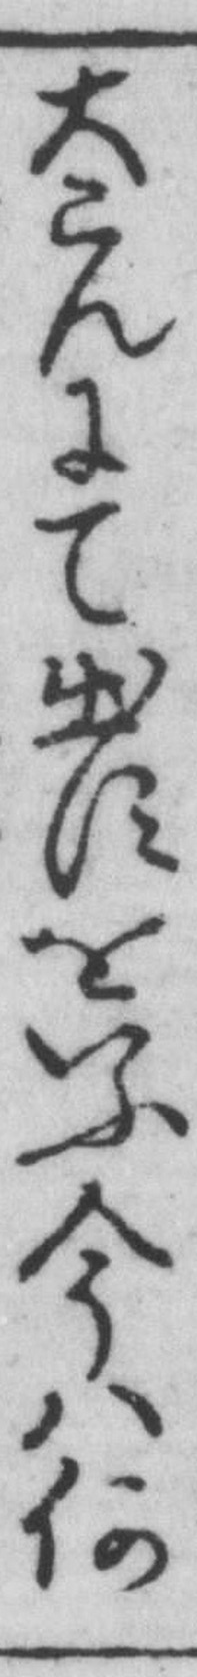大こんにて出すをいふ今ハ何
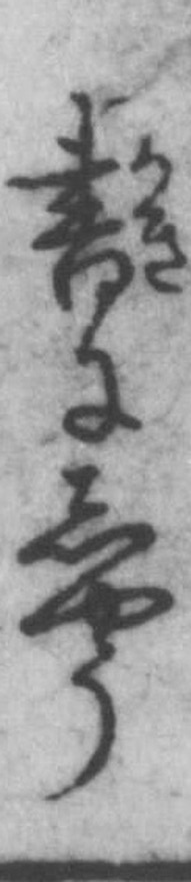書にしやう
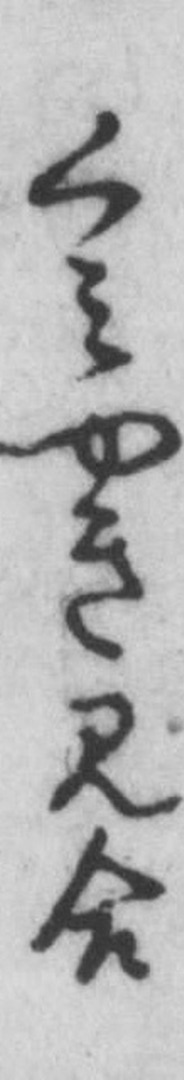くミやき見合
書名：料理献立抄
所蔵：大阪府立大学学術情報センター 国文学研究資料館
